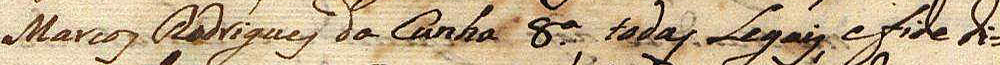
Marcos Rodrigues da Cunha 8.a, todas Legais, e fidedi
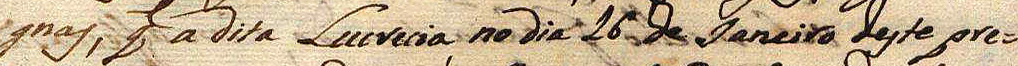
gnas, q̄ a dita Lucrecia, no dia 16 de janeiro deste pre
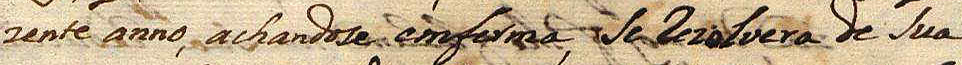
zente anno, achandose emferma, se Rezolvera de sua
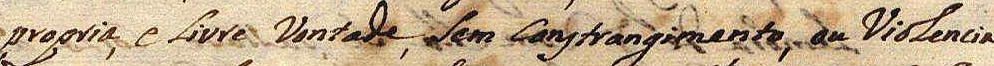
propria, e livre vontade, sem constrangimento, ou VioLencia
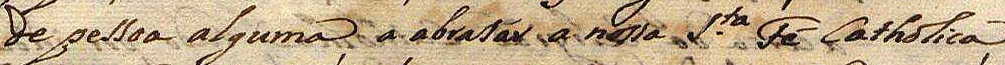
de pessoa alguma, a abrasár a nossa s.ta Fé Catholica,
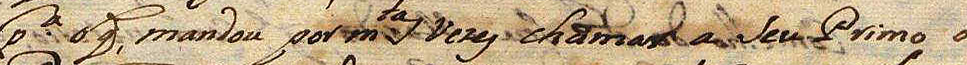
p.a o q̄, mandou por mtas vezes chamar a seu Primo o
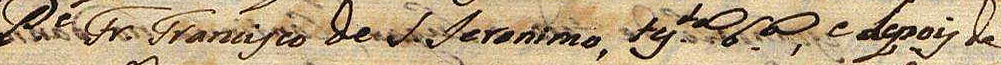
P.e Fr. Francisco de Ieronimo, tes.ta 6.a, e depois de
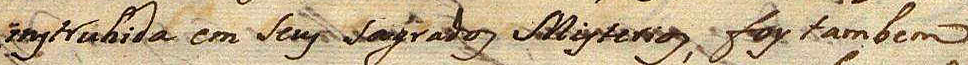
instruhida em seus sagrados Misterios, foy tambem
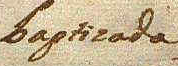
baptizada
